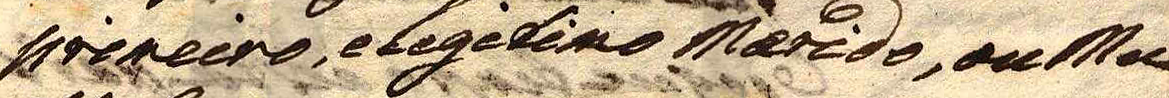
primeiro, e Legitimo marido, ou Mu
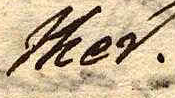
lher.
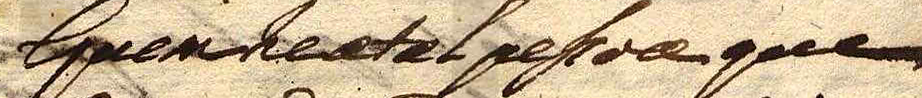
Quem he a taL pessoa que
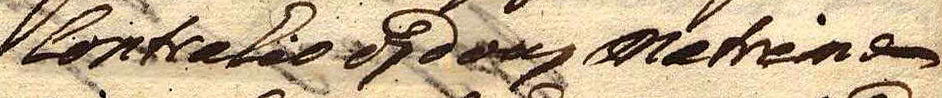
Contrahio os dous matrimo
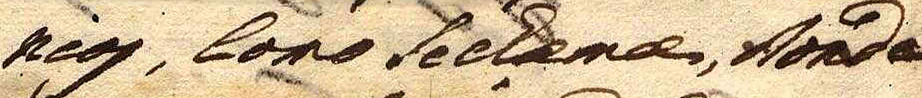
nios, Como se chama, donde
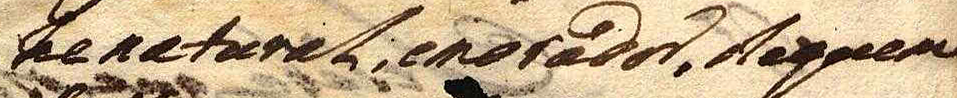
he naturaL, e morador, de quem
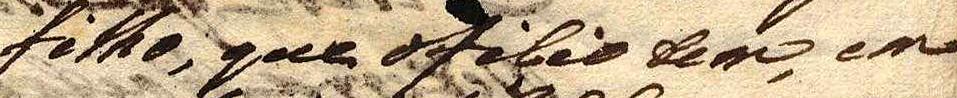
filho, que ofiLio tem, em
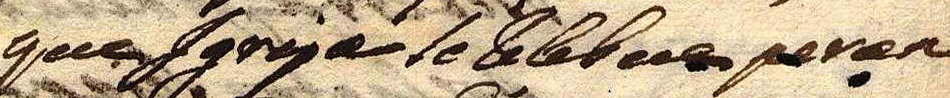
que Jgreja se ReCebeu peran
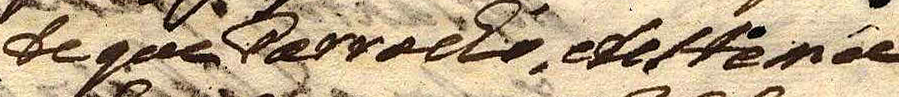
te que Parrocho, e testemu
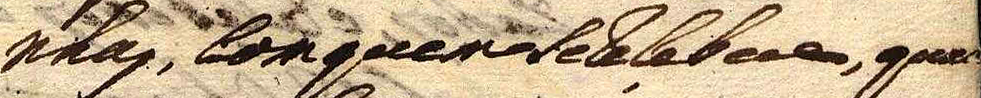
nhas, Com quem se ReÇebece, quan
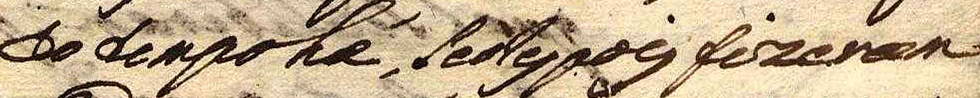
to tempo há, se despois fizeram
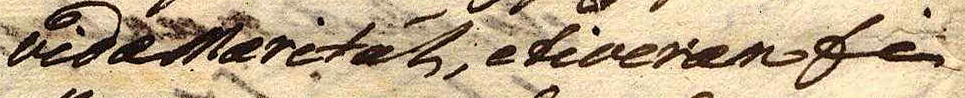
vida maritáL, e tiveram fi
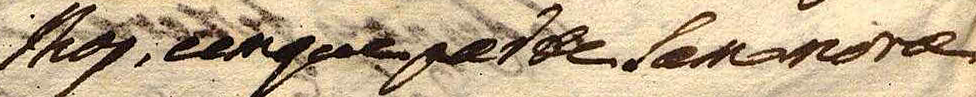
lhos, e em que parte sam mora
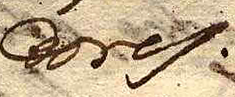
dores.
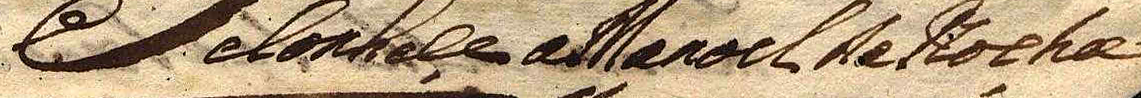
Se Conheçe a Manoel de Roçha
